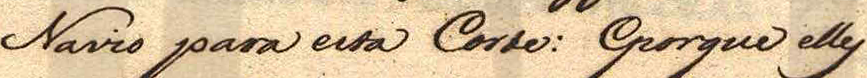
Navio para esta Corte: E porque elles
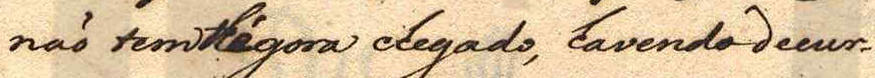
naõ tem thé gora chegado, havendo decur
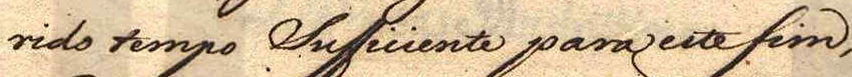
rido tempo Sufficiente para este fim;
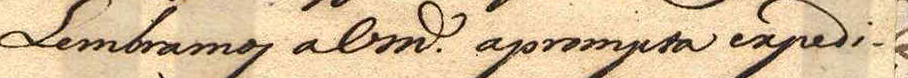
Lembramos a Vm.e a prompta expedi
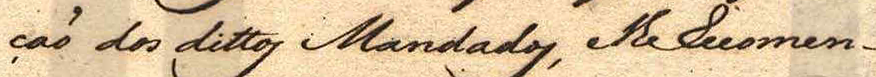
çaõ dos dittos Mandados, e lhe Recomen
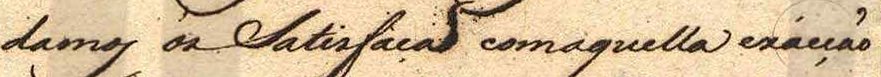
damos os Satisfação com aquella exacção
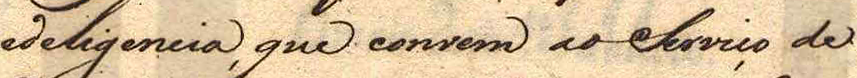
e deligencia, que convem ao Serviço de
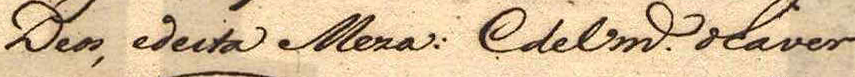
Deos, e desta Meza: E de Vm.e o haver
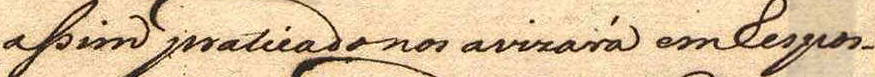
assim praticado nos avizará em Respos
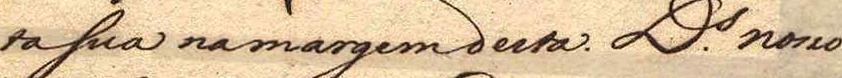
ta sua na margem desta. D.s nosso
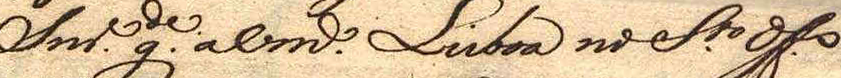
Snr.o g.de a vm.e Lisboa no S.to Off.o
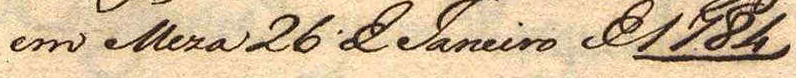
em Meza 26 de Ianeiro de 1784
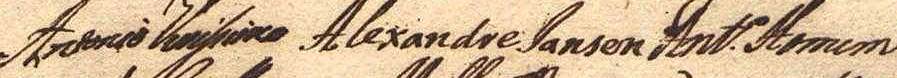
Antonio Verissimo Alexandre Iansen Ant.o Homem
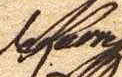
de Larre
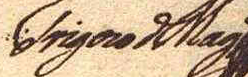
Frigozo d Mag
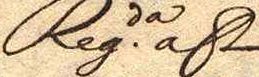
Reg.da a fl
